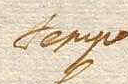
tempo
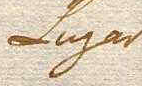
Lugar
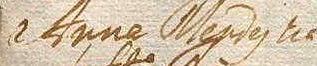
Anna Mendes tia
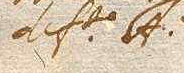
deft.o A.
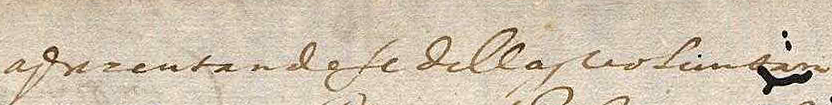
aprezentandose dellas uoluntara
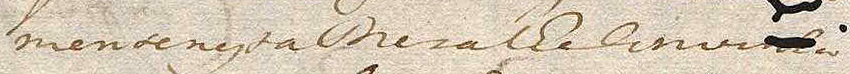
mente nesta Meza lhe convinha
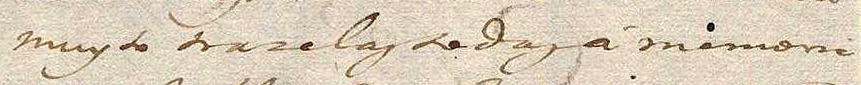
muyto trazelas todas á memoria
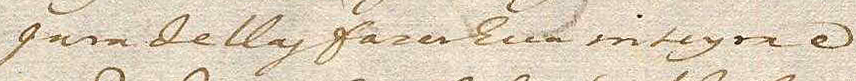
para dellas fazer hua inteyra e
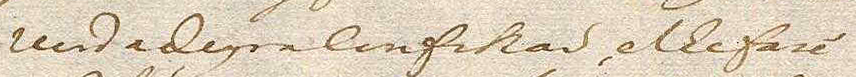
uerdadeyra confissaõ, e lhe fazē
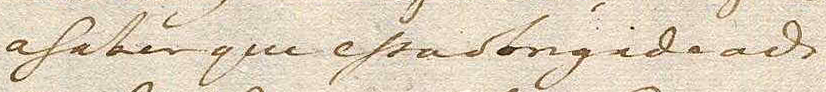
a saber que esta obrigada a di
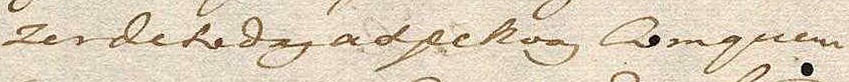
zer de todas as pessoas com quem
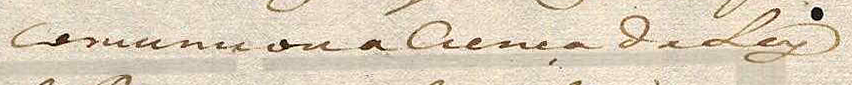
comunicou a crença de Ley
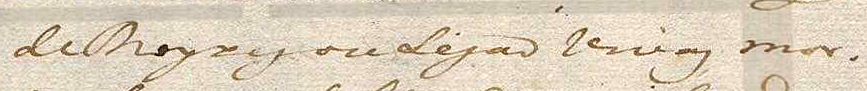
de Moyzes ou sejaõ vivas, mor
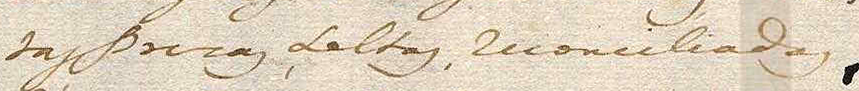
tas, prezas, soltas, Reconciliadas
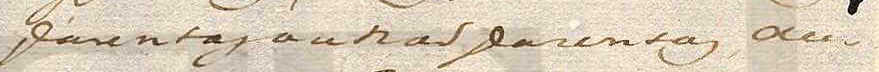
parentas ou não parentas, au
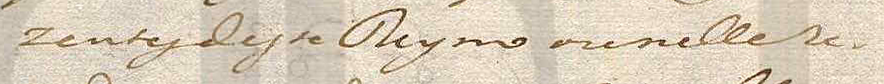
zentes deste Reyno ou nelle re
